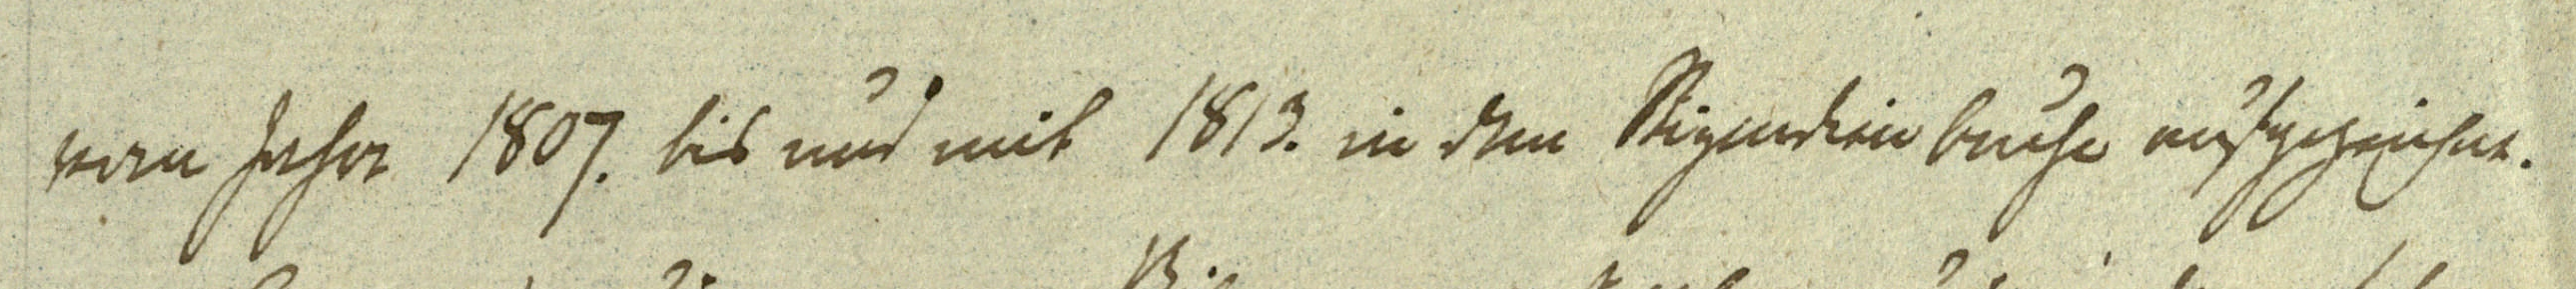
vom Jahre 1807. bis und mit 1813. in dem Stipendienbuche aufgezeichne¬
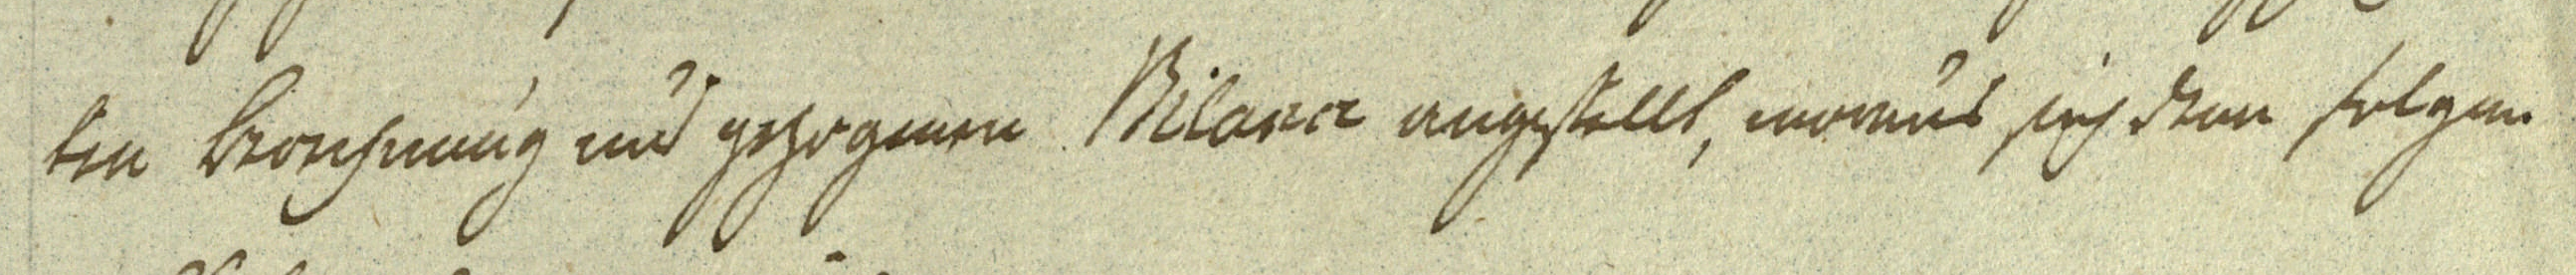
ten Berechnung und gezogenen Bilance angestellt, woraus sich denn folgen¬
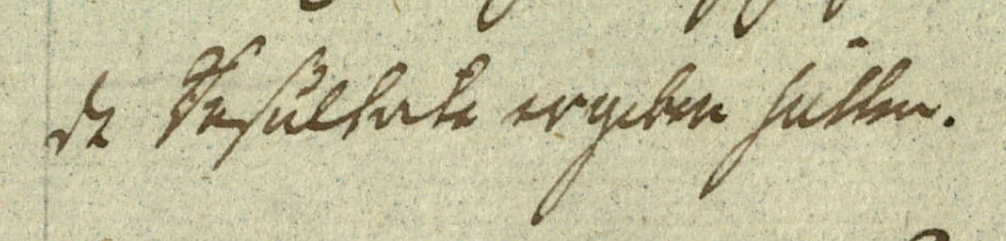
de Resultate ergeben hätten.
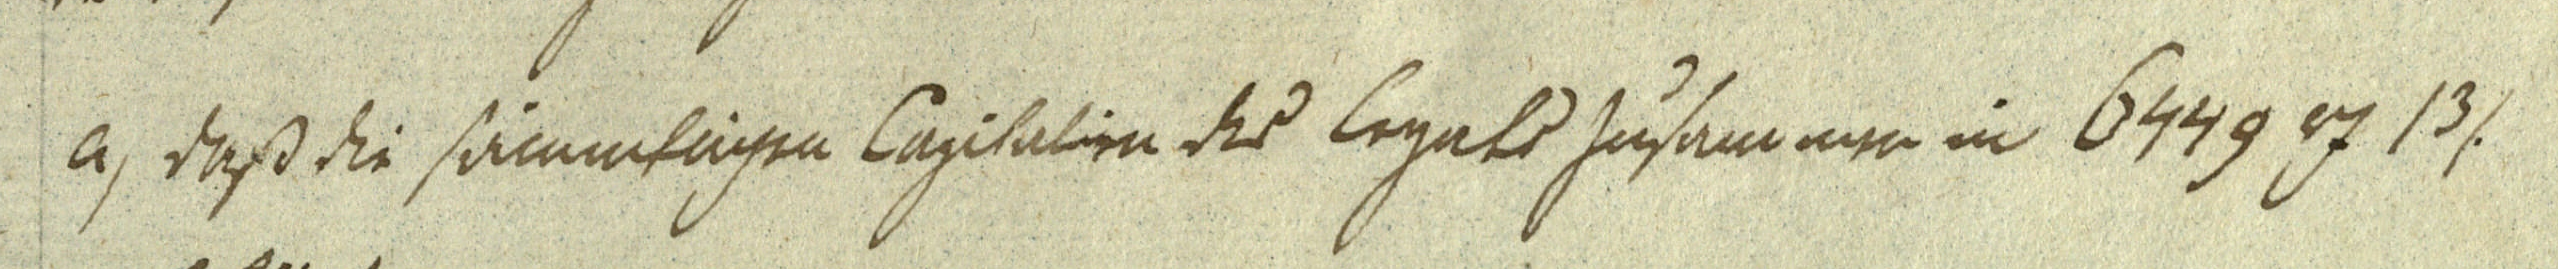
a, daß die sämmtlichen Capitalien des Legats zusammen in 6449 rt 13 s.
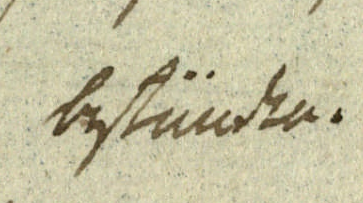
bestünden.
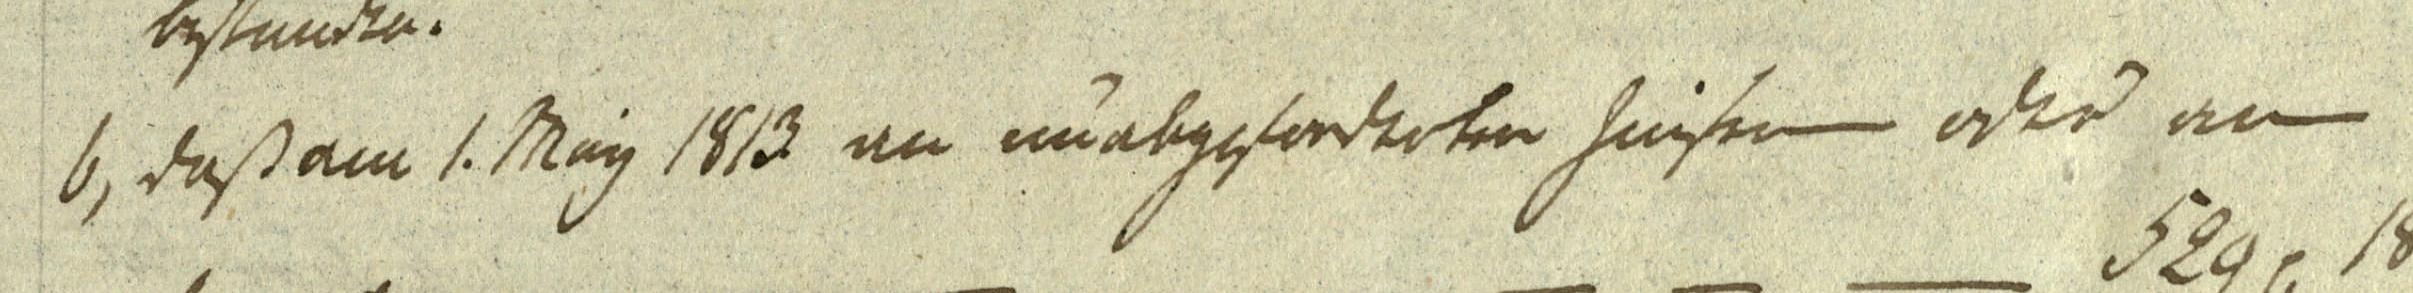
b, daß am 1. Maÿ 1813 an unabgeforderten Zinsen oder an
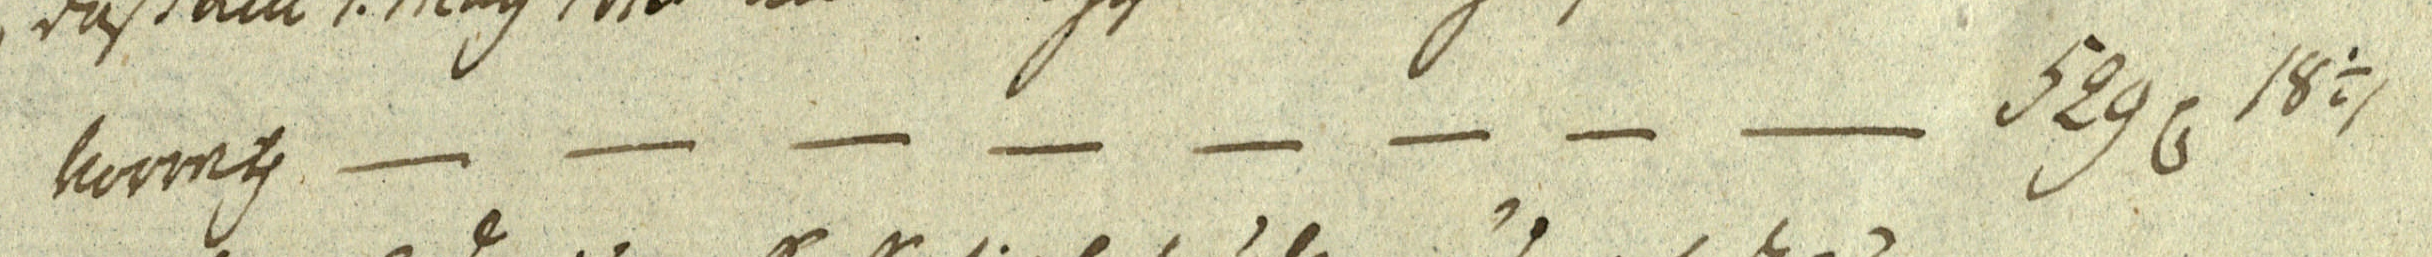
Vorrath 529 l. 18
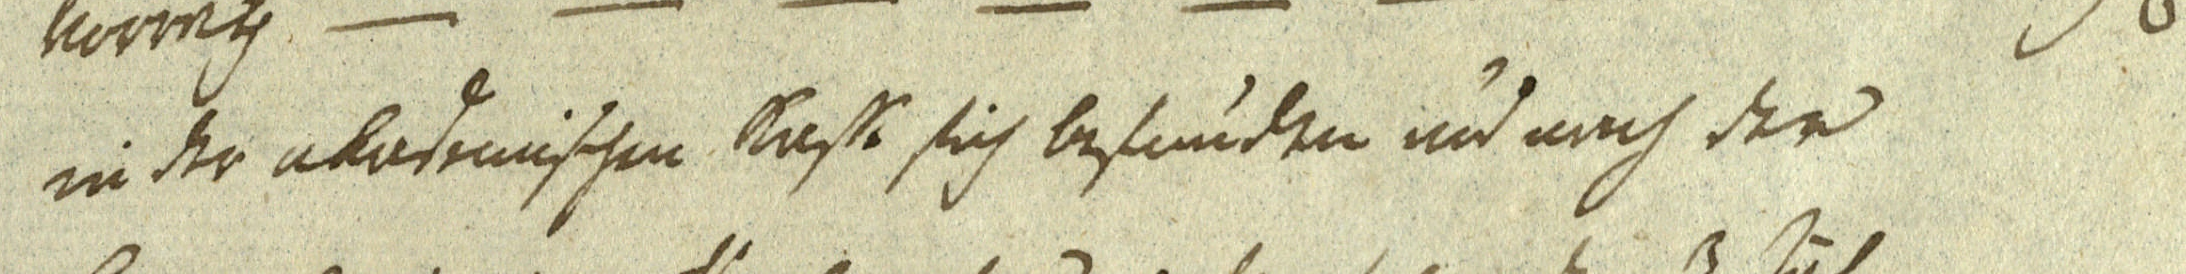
in der akademischen Kasse sich befunden und nach der
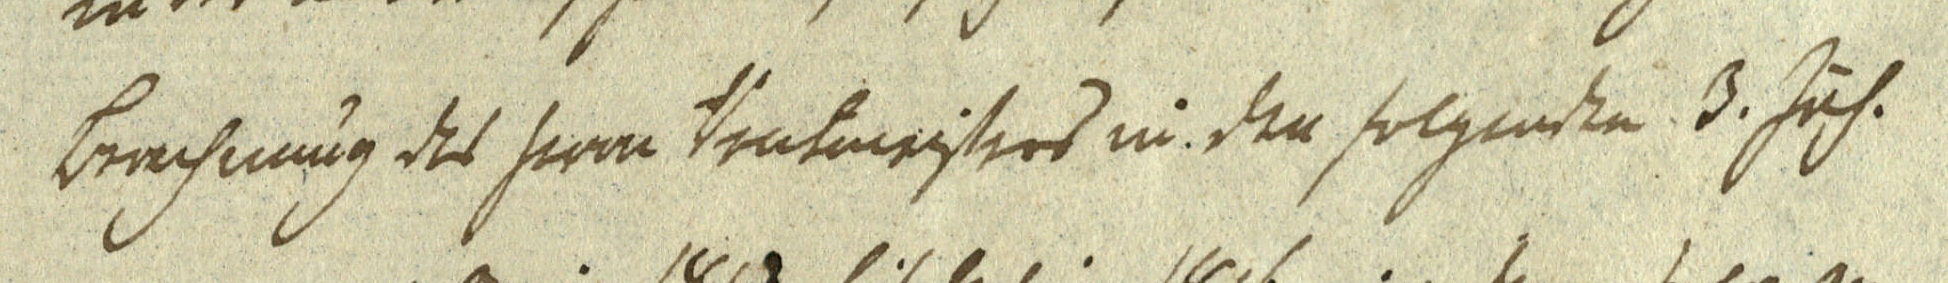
Berechnung des Herrn Rentmeisters in den folgenden 3. Jah¬
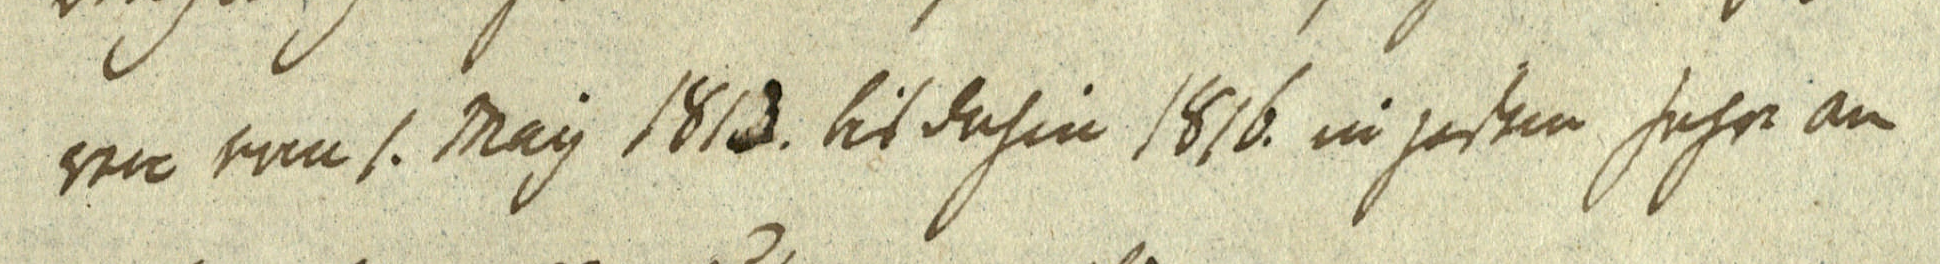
ren vom 1. Maÿ 1813. bis dahin 1816. in jedem Jahre an
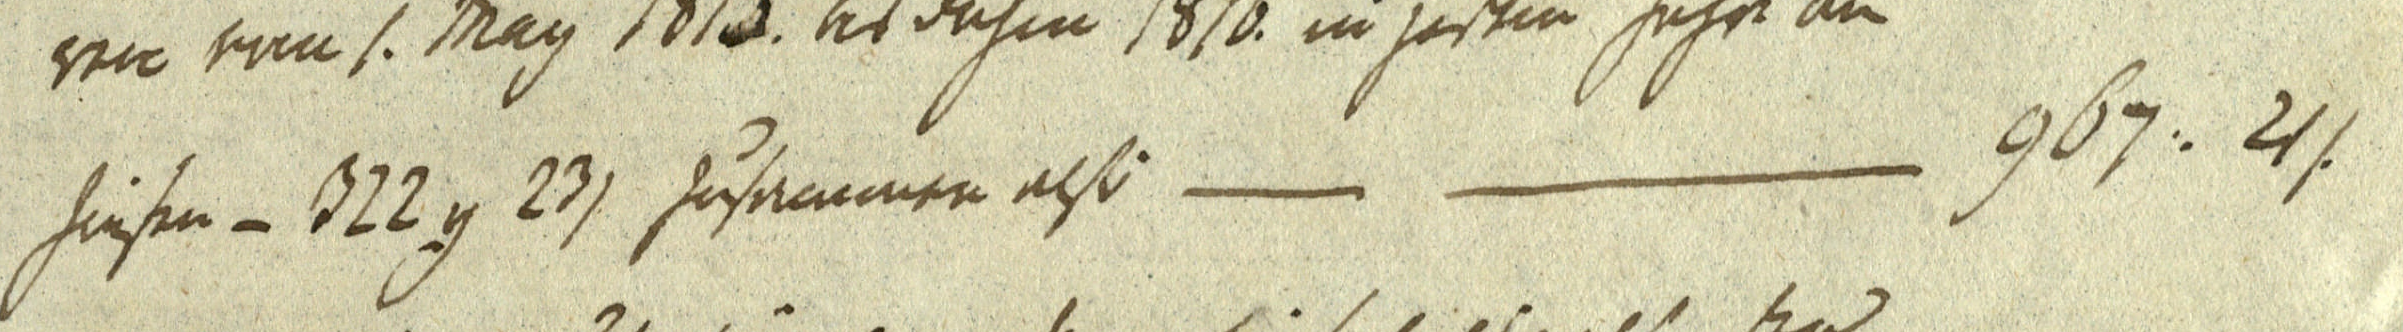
Zinsen 322 rt 23s zusammen also 967. 21s.
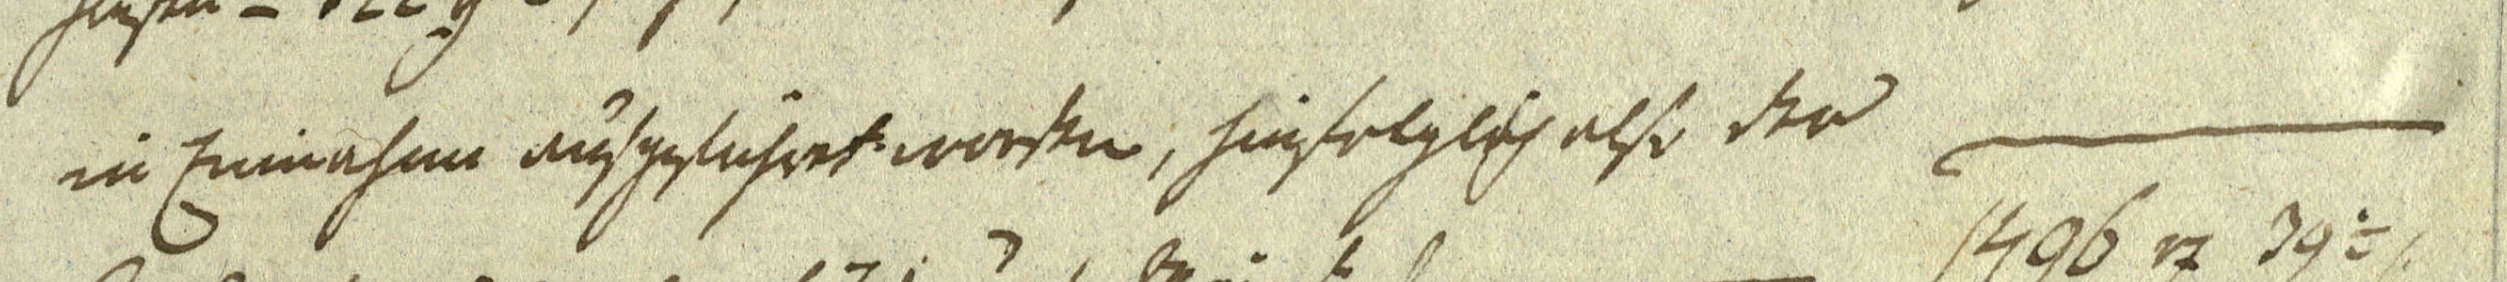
in Einnahme aufgeführet worden, hinfolglich also der
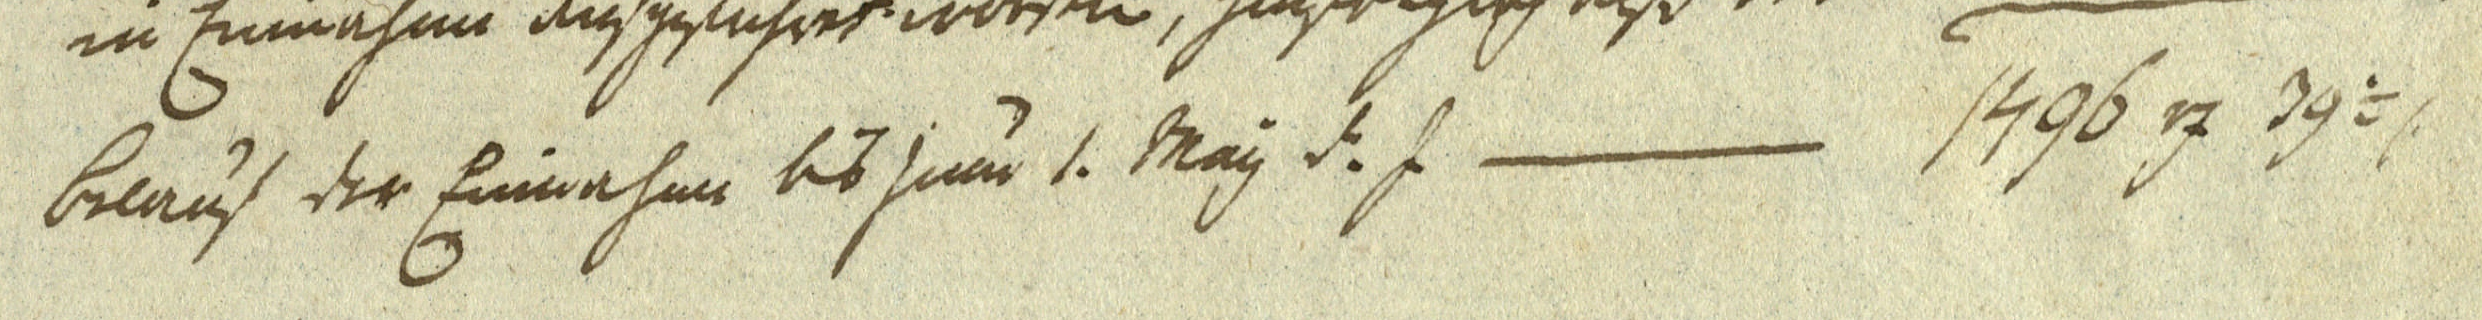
Belauf der Einnahme bis zum 1. Maÿ d. J. 1496 rt 39.,
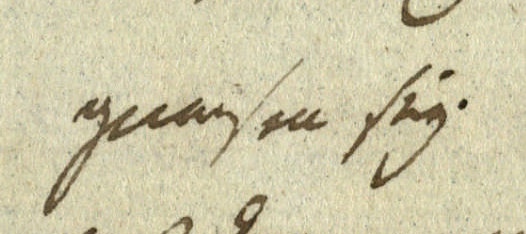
gewesen seÿ.
